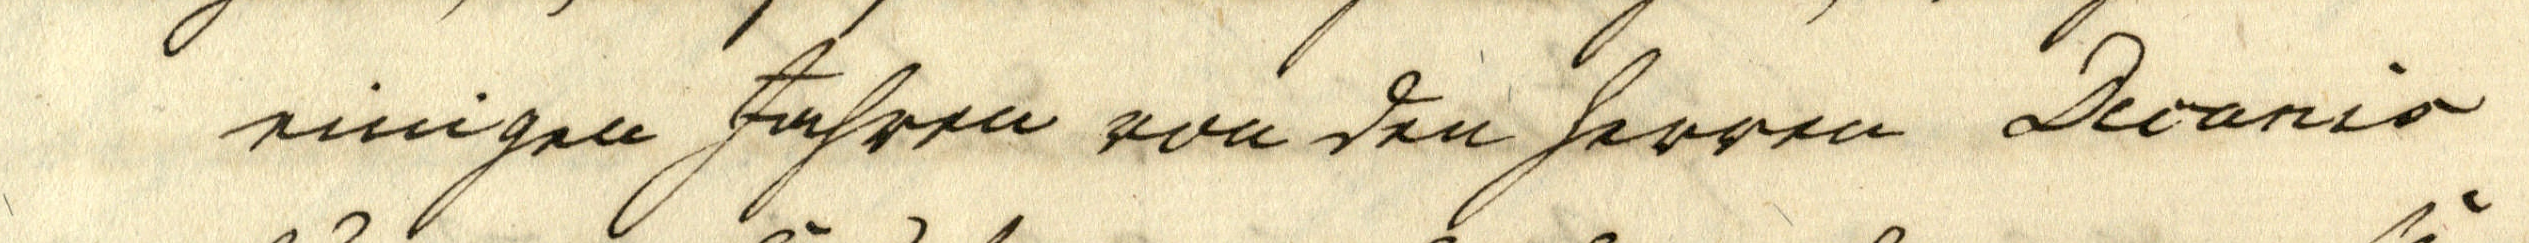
einigen Jahren von den Herren Decanis
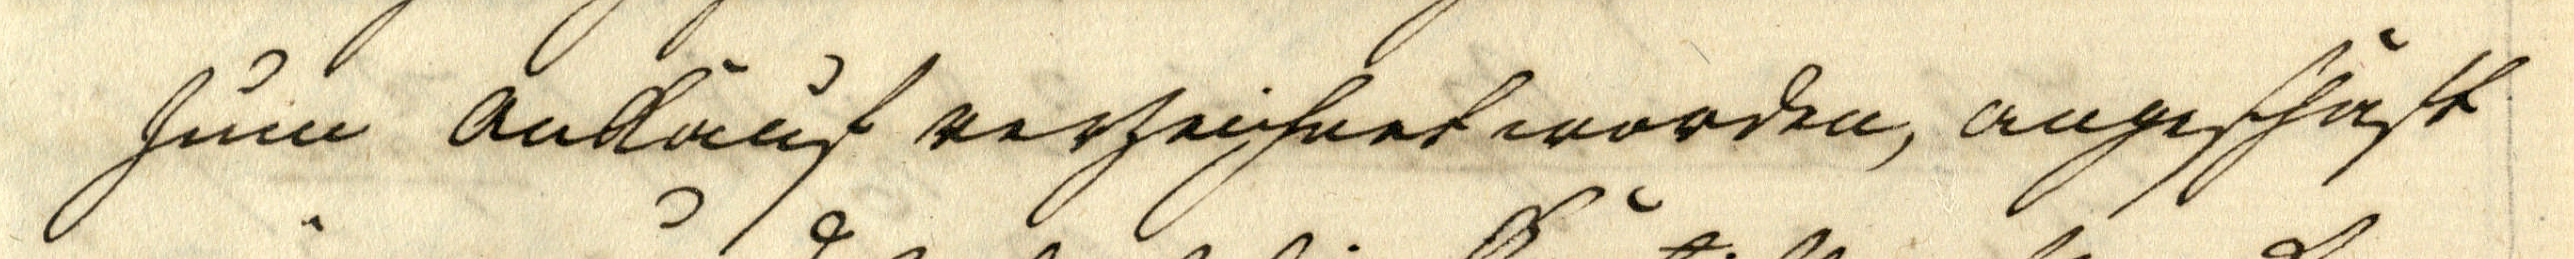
zum Ankauf verzeichnet worden, angeschaft
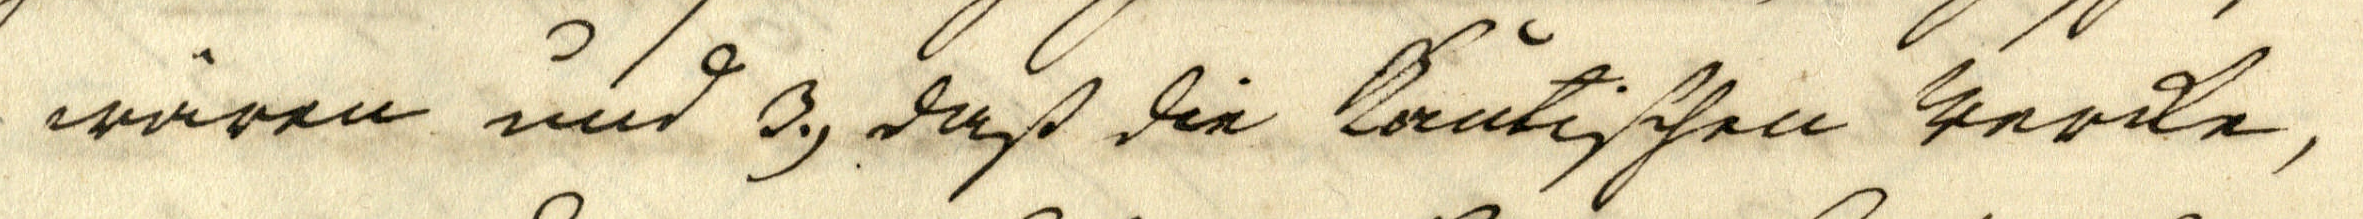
wären und 3., daß die Kantischen Werke,
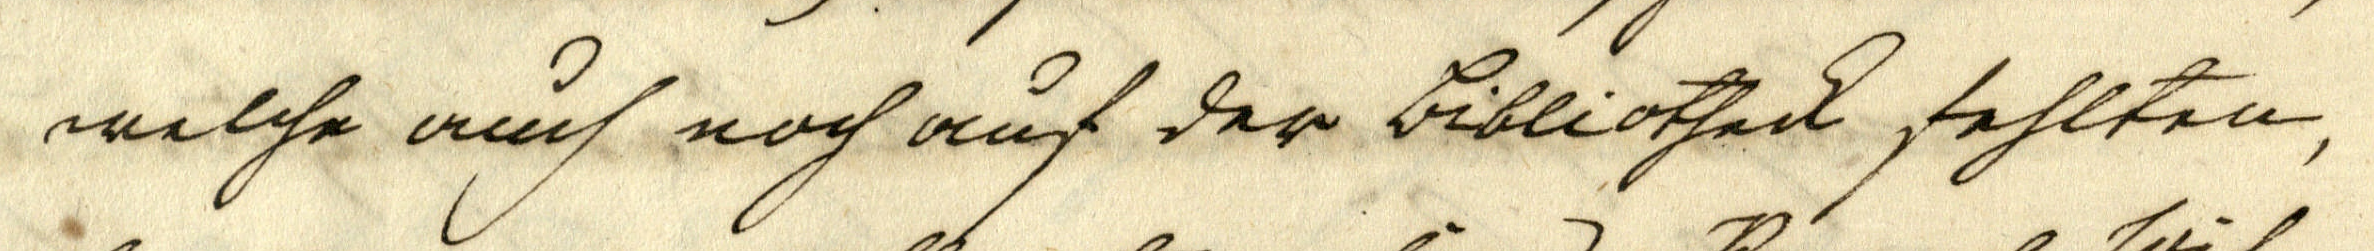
welche auch noch auf der Bibliothek fehlten,
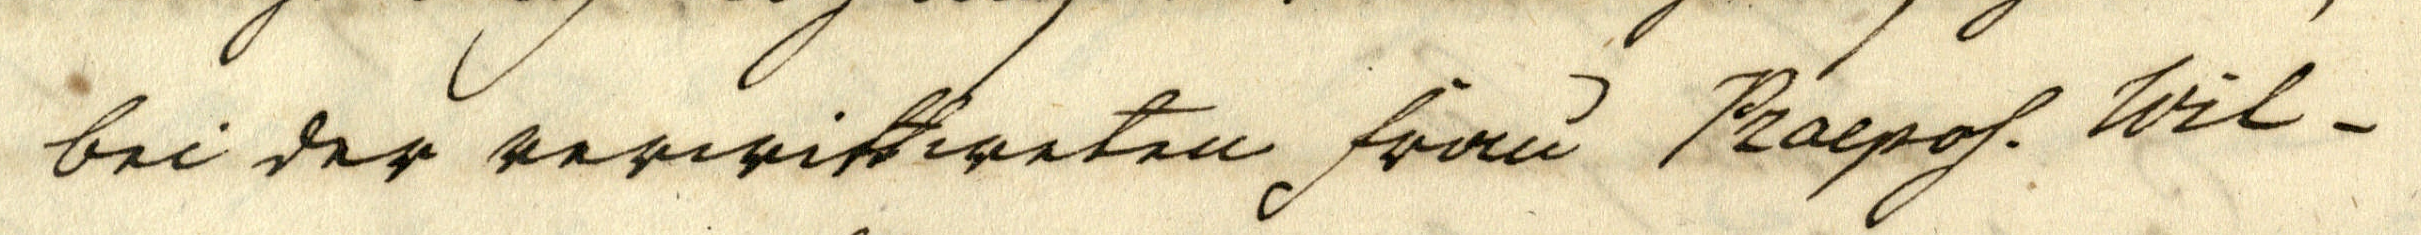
bei der verwittweten Frau Praepos. Wil-
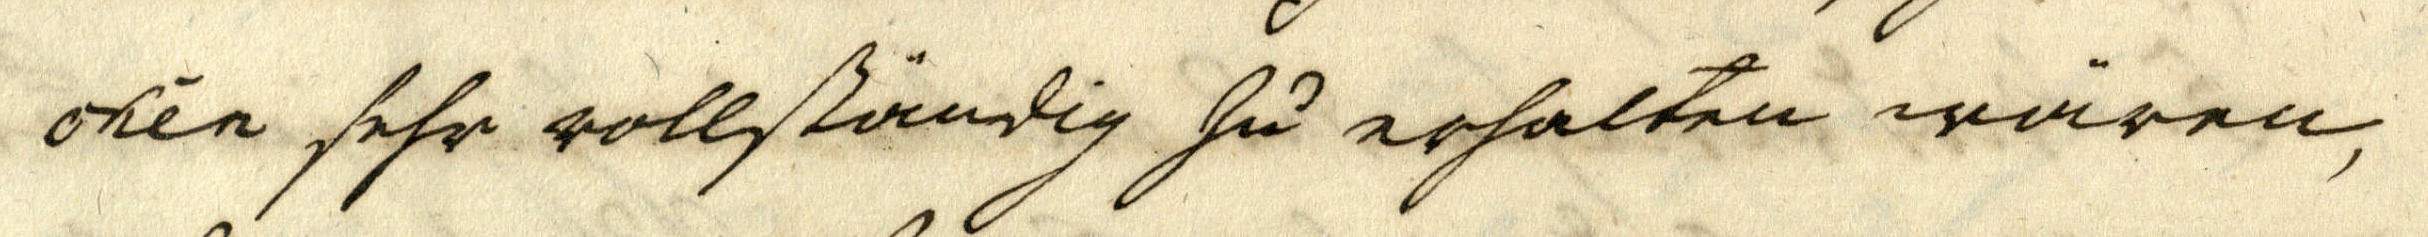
cken sehr vollständig zu erhalten wären,
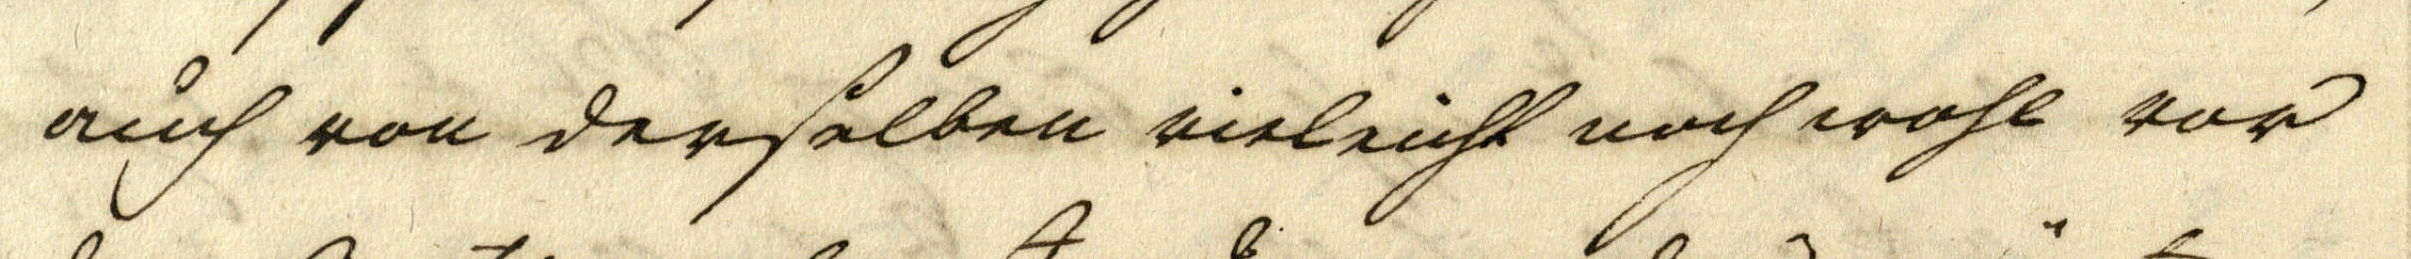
auch von derselben vieleicht noch wohl vor
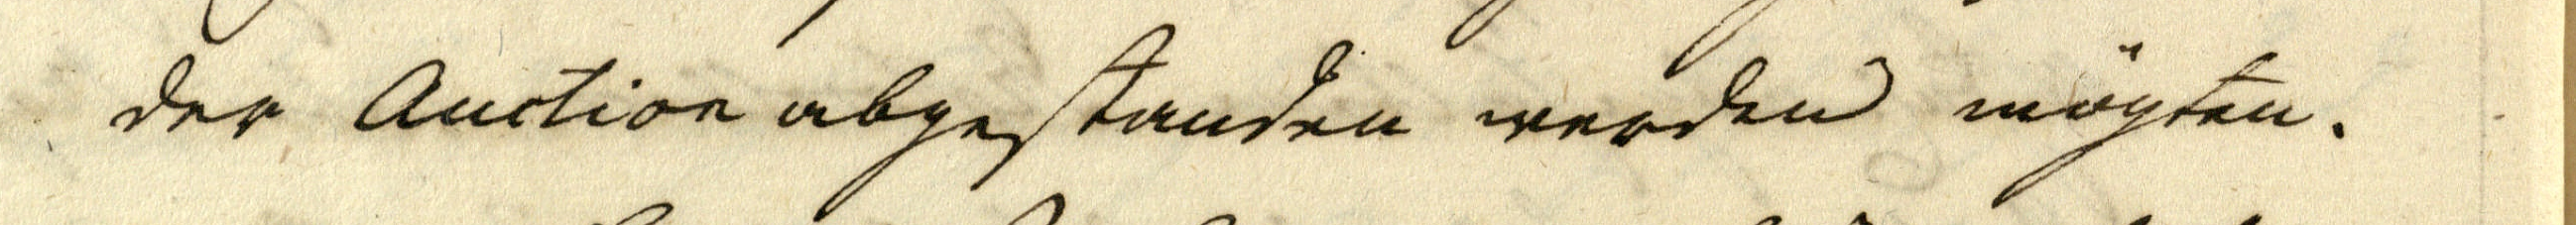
der Auction abgestanden werden mögten.
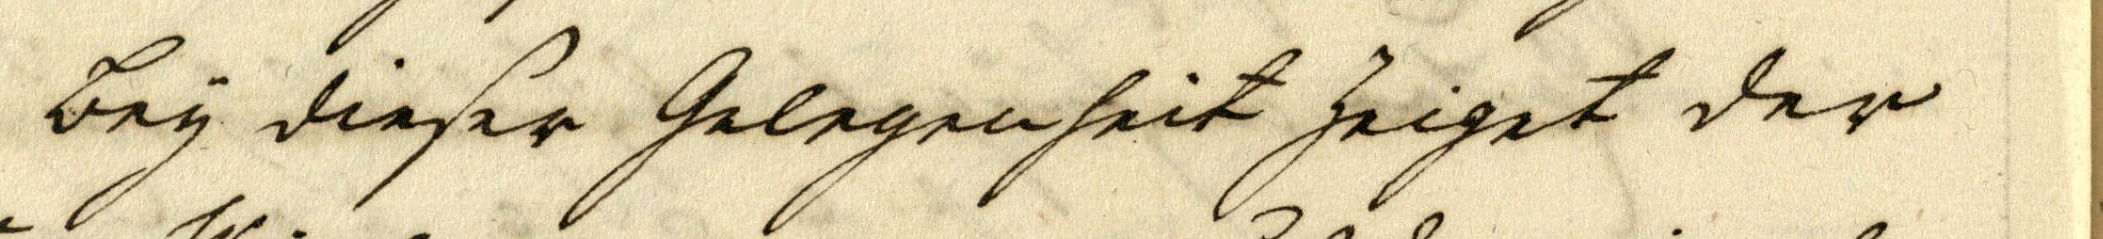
Bey dieser Gelegenheit zeiget der
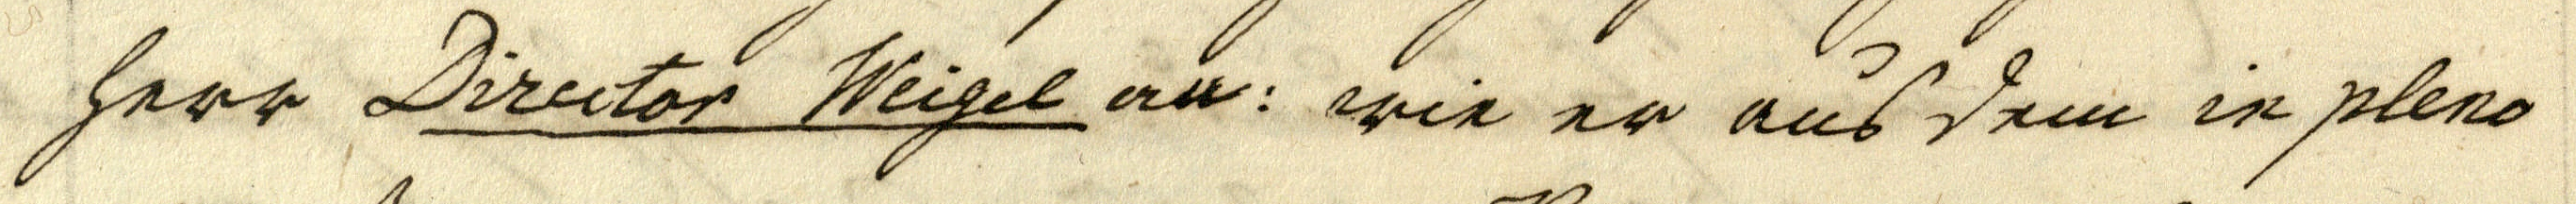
Herr Director Weigel an: wie er aus dem in pleno
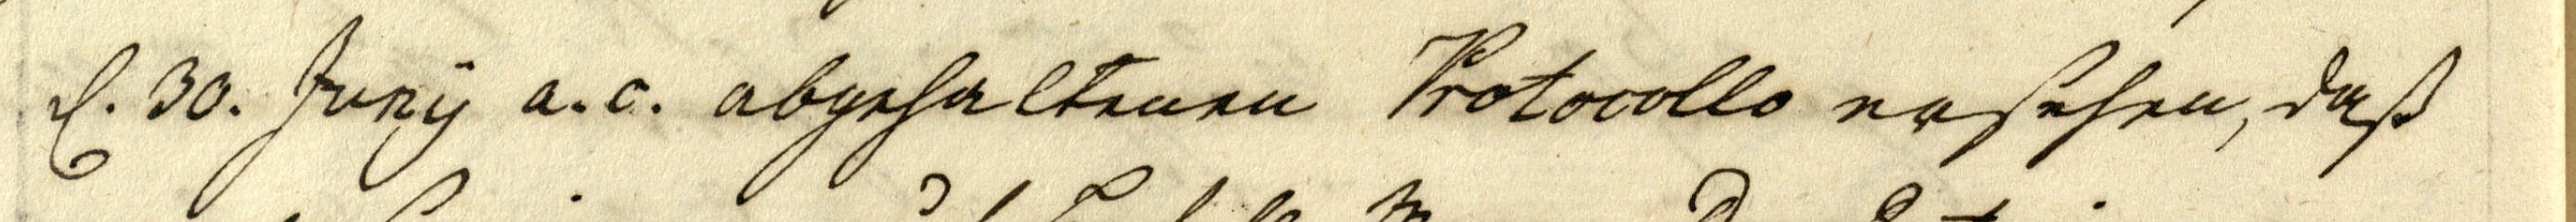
d. 30. Juny a. c. abgehaltenen protocolle ersehen, daß
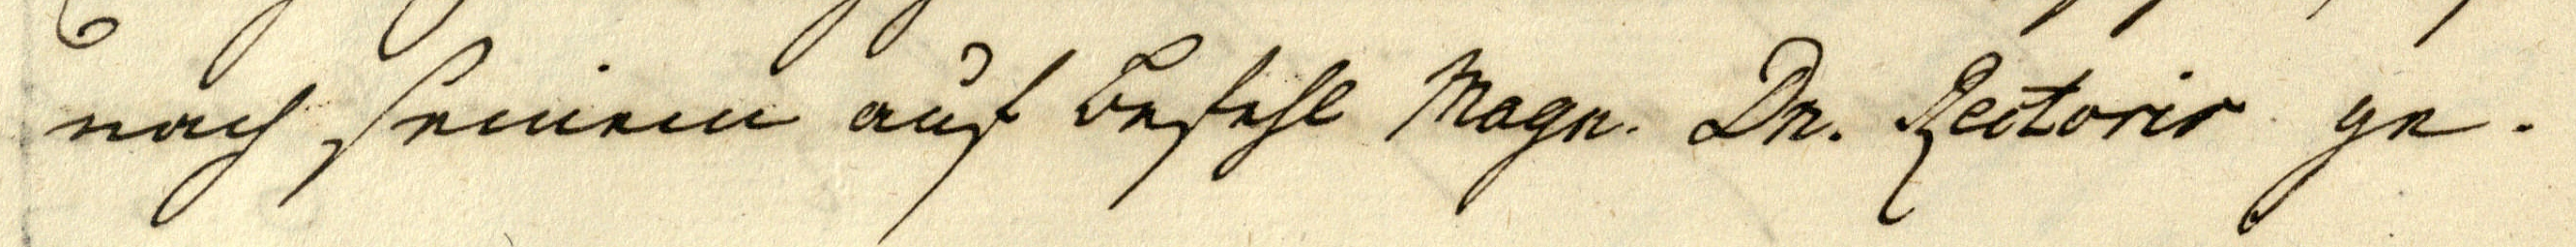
nach seinem auf Befehl Magn. Dn. Recotris ge-
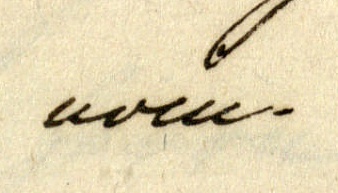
nom-
